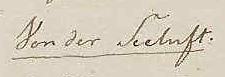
Von der Seeluft.
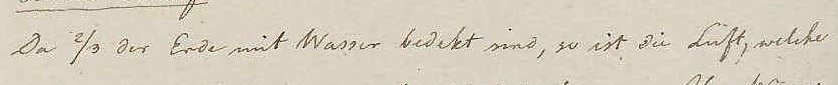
Da ⅔ der Erde mit Wasser bedekt sind, so ist die Luft, welche
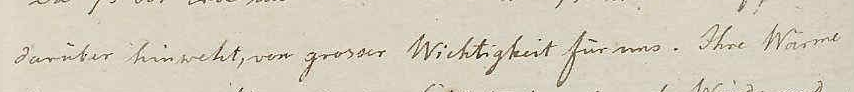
darüber hinweht, von grosser Wichtigkeit für uns. Ihre Wärme
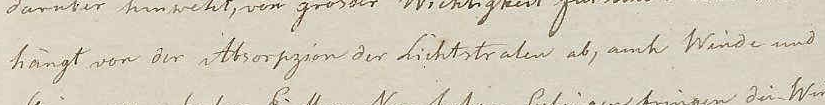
hängt von der Absorpzion der Lichtstralen ab, auch Winde und
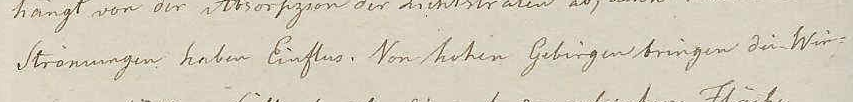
Strömungen haben Einflus. Von hohen Gebirgen bringen die Win-
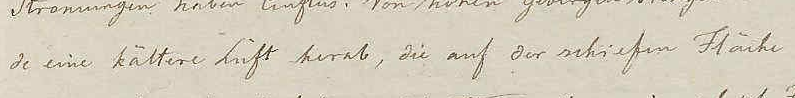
de eine kältere Luft herab, die auf der schiefen Fläche
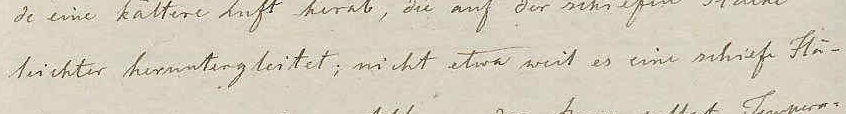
leichter heruntergleitet; nicht etwa weil es eine schiefe Flä-
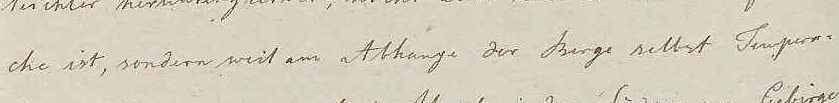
che ist, sondern weil am Abhange der Berge selbst Tempera-
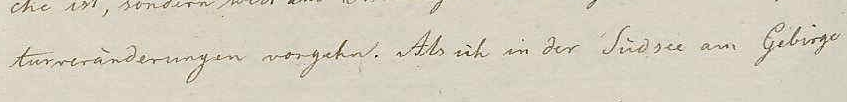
turveränderungen vorgehn. Als ich in der Südsee am Gebirge
